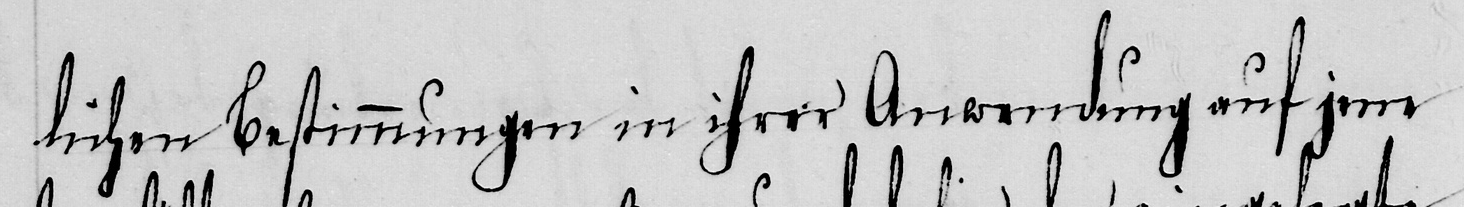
lichen Bestimmungen in ihrer Anwendung auf jene
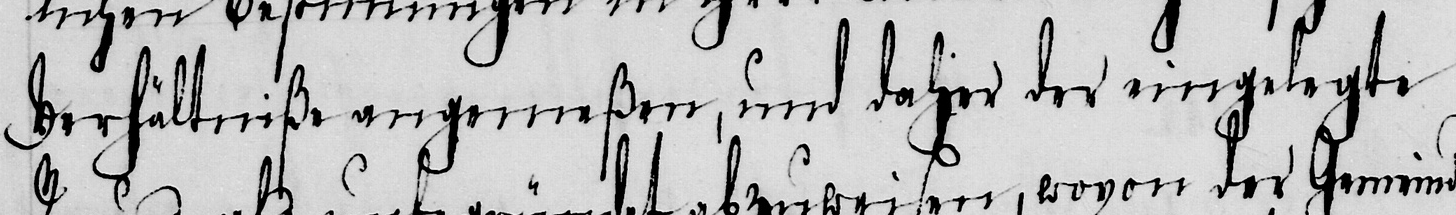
Verhältniße angemeßen, und daher der eingelegte
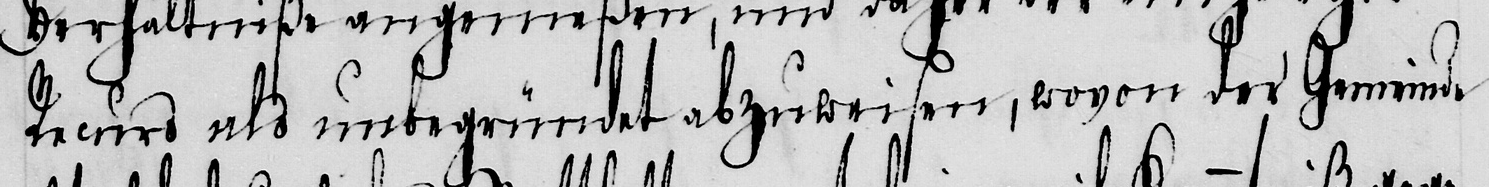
Recurs als unbegründet abzuweisen, wovon der Gemeinde
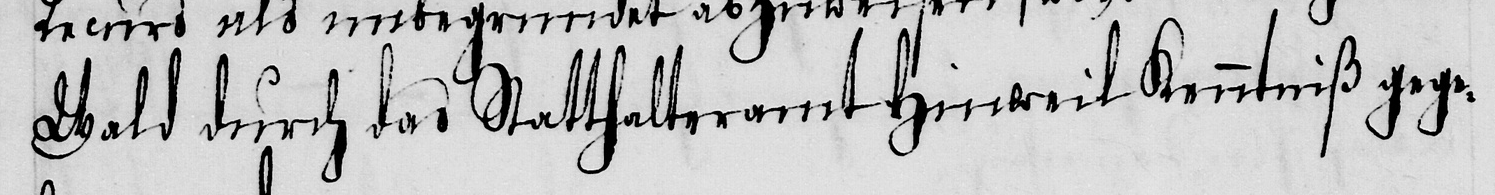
Wald durch das Statthalteramt Hinweil Kenntniß gege¬
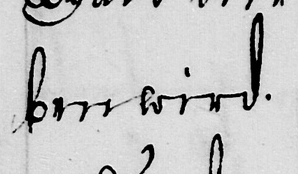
ben wird.
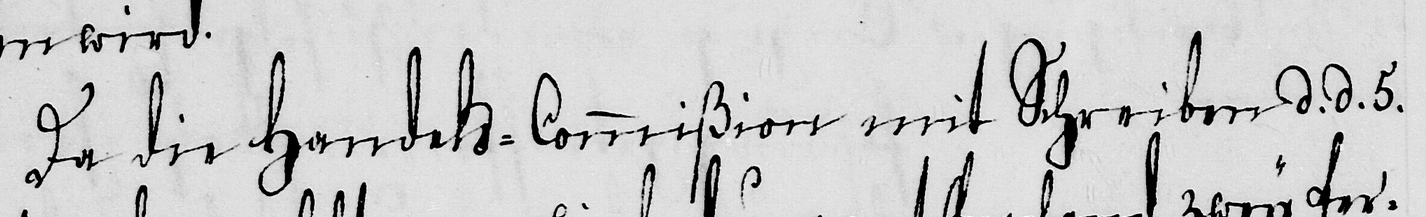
Da die Handels-Commißion mit Schreiben d. d. 5.
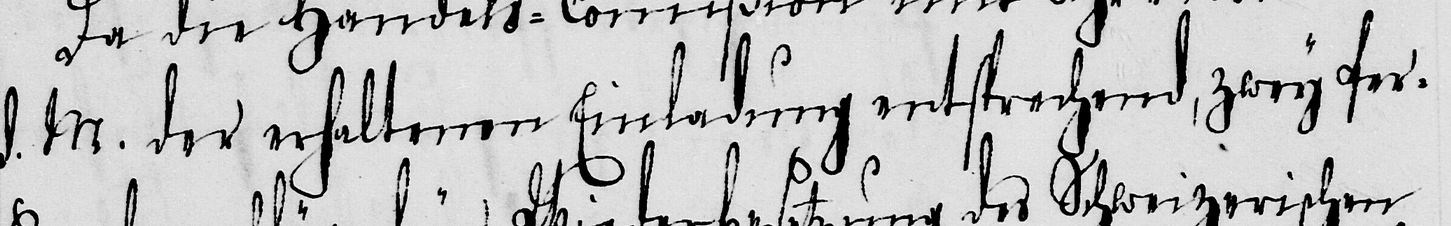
M. der erhaltenen Einladung entsprechend, zwey Per¬
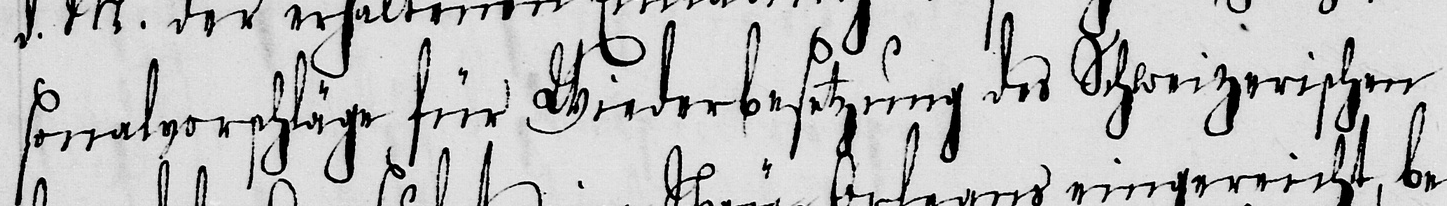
sonalvorschläge für Wiederbesetzung des Schweizerischen
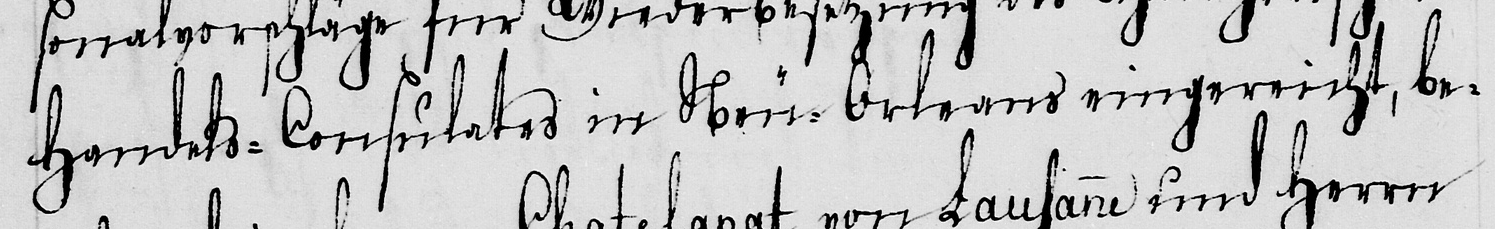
Handels-Consulates in Neu-Orleans eingereicht, be¬
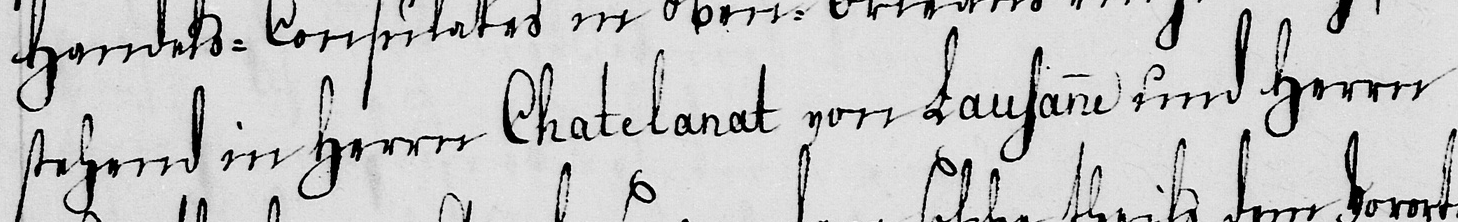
stehend in Herrn Chatelanat von Lausanne und Herrn
